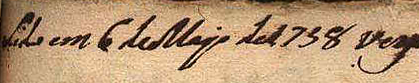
lido em 6 de Majo de 1758 vesp
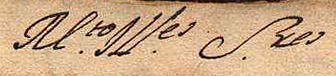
M.to Ill.es S.res
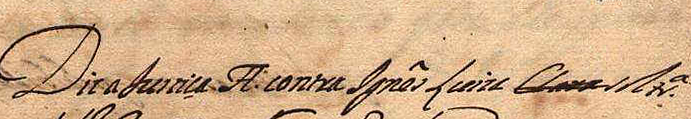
Diz a Iustiça A. contra Ignês Luiza Clara soltr.a
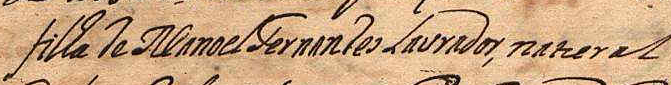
filha de Manoel Fernandes Lavrador, natural
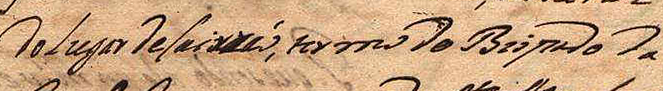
do Lugar de Cairraõ, termo do Bispado da
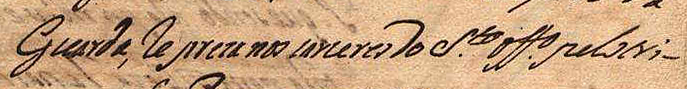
Guarda, Re preza nos carceres do S.to off.o pelo cri
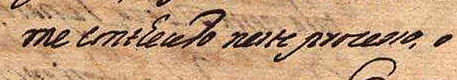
me contheudo neste processo, o
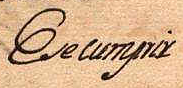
E se cumprir
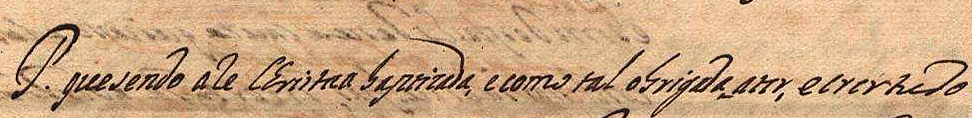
P. que sendo a Re Christaa baptizada, e como tal obrigada a ter, e crer tudo
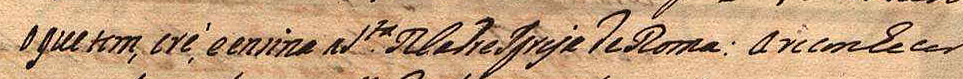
o que tem, cré, e ensina a s.ta Madre Igreja de Roma: a reconhecer
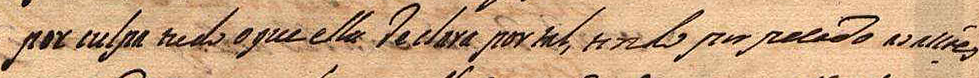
por culpa tudo o que ella declara por tal, tendo por pecado as acçoẽs
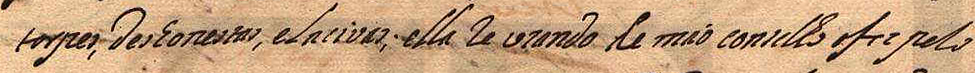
torpes, deshonestas, e lacivas; ella Re vzando de mao conselho o fez pelo
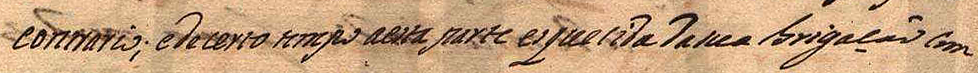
contrario; e de certo tempo a esta parte esquecida da sua obrigaçaõ com
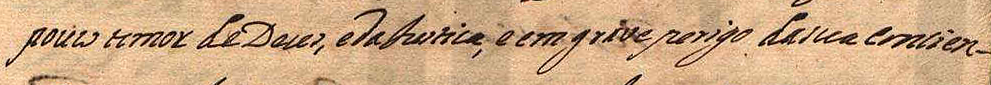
pouco temor de Deus, e da Iustiça, e em grave perigo da sua concien
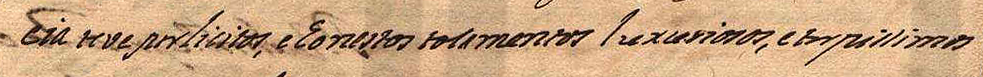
cia teve por licitos, e honestos tocamentos luxuriosos, e torpissimos
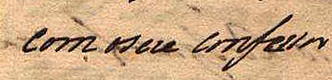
com o seu confessor
